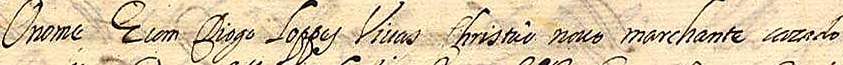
O nome E com Diogo Loppes Viuas Christão nouo marchante cazado
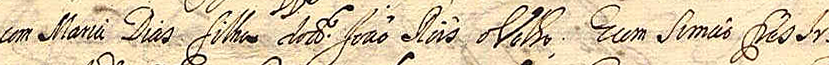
com Maria Dias filha do d̄o. Joaõ Rois̄ o Velho; E com Simaõ frēs Ir
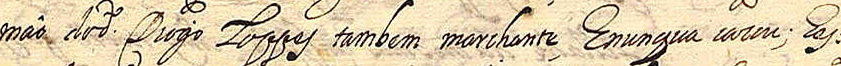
maõ do dō. Diogo Loppes tambem marchante, E nunqua cazou; E es
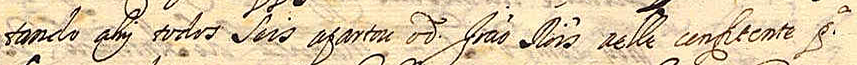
tando ahy todos Seis apartou o d̄. Joaõ Rois̄ a elle confitente p.a
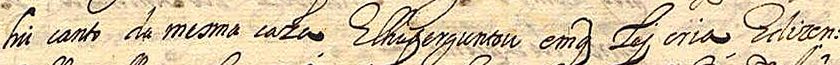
hū canto da mesma caza, E lhe perguntou em q̄ Lej cria, E dizen
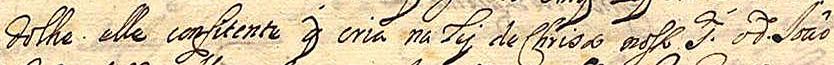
dolhe elle confitente q̄ cria na Lej de Christo nosso s.or o d̄o. Ioaõ
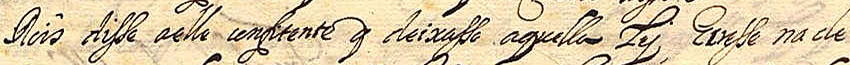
Rois̄ disse a elle confitente q̄ deixasse aquella Lej, E cresse na de
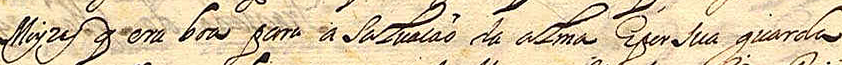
Moyzes q̄ era boa para a SaLuacaõ da aLma E por sua guarda
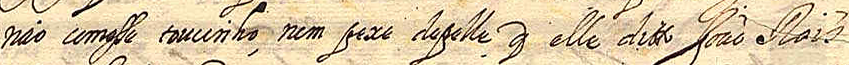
naõ comesse toucinho nem pexe de pelle, q̄ elle ditto Joaõ Rois̄
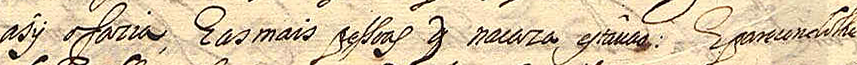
asy o fazia, E as mais pessoas q̄ na caza estaūao: E parecendolhe
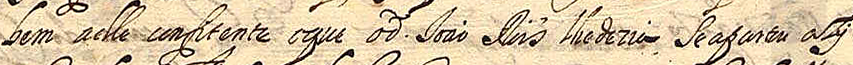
bem a elle confitente o que o d̄. Ioaõ Rois̄ lhe dezia, Se apartou aLy
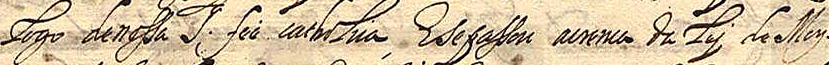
Logo de nossa Sta. feé cathoLica, E se passou a crenca da Lej de Moy
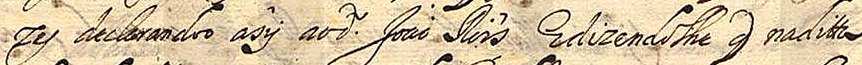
zes declarando asy ao d̄. Joaõ Rois̄ E dizendolhe q̄ na ditaa
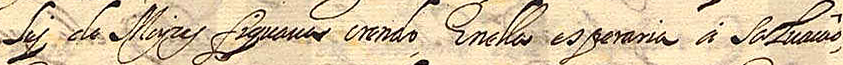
Lej de Moyzes fiquaua crendo, E nella esperaria á SaLuacaõ,
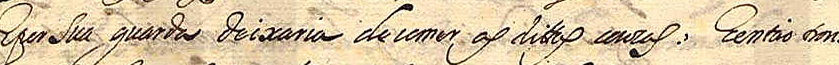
E por Sua guarda deixaria de comer as dittas couzas. E entaõ trou
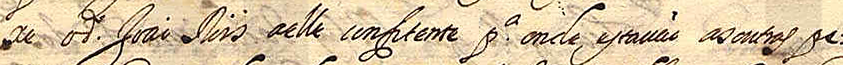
xe o d̄. Joaõ Rois̄ a elle confitente p.a onde estauaõ as outras pe
